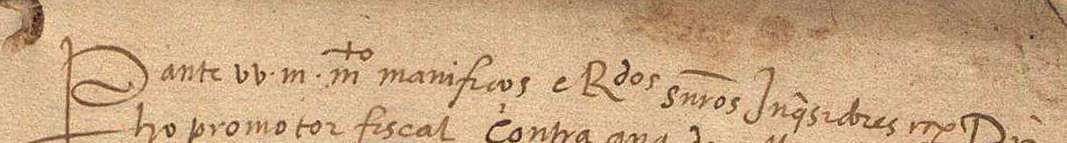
Ꝑante vv. m. mto manificos e Rdos s̄nres Inq̄sidores ccꝭ Diz
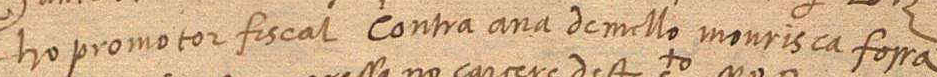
ho promotor fiscal contra ana de mello mourisca forra
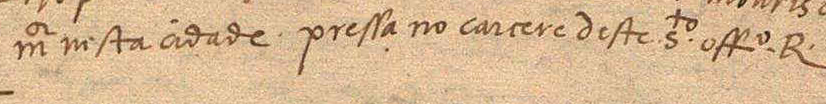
mor nesta cidade pressa no carcere deste sto. offo. R.
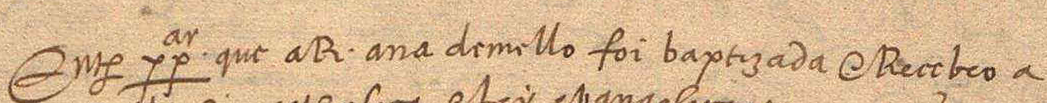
Entꝭ ꝑꝑar que a R. ana de mello foi baptizada e Recebeo a
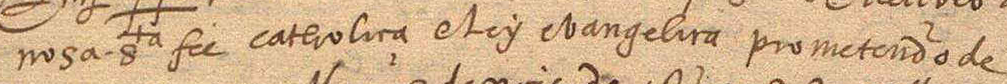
nosa sta fee catholica e Ley evangelica prometendo de
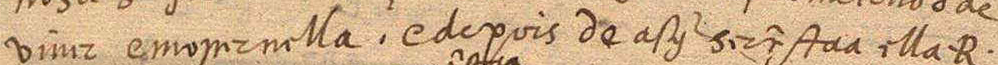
viuer e morrer nella. e depois de asy ser c̄staa ella .R.
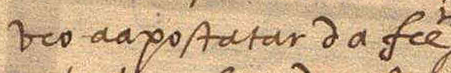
veo a apostatar da fee
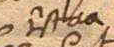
c̄staa
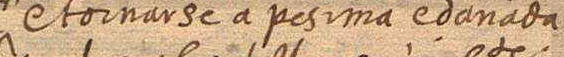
e tornarse a pesima e dan̄ada
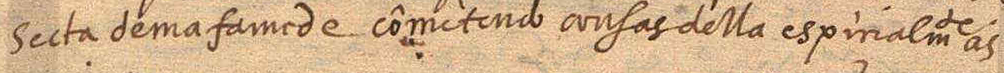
secta de mafamede cōmetendo cousas della espicialmte as
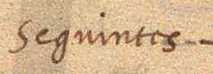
seguintes –
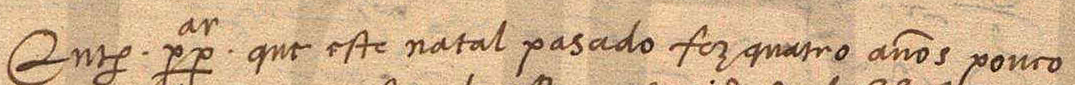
Entꝭ. ꝑꝑar. que este natal pasado fez quatro an̄os pouco
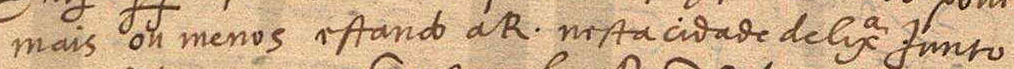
mais ou menos estando a R. nesta cidade de lixa Junto
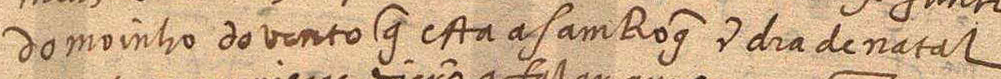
do moinho do vento q̄ esta a sam Roq̄ ē dia de nataL
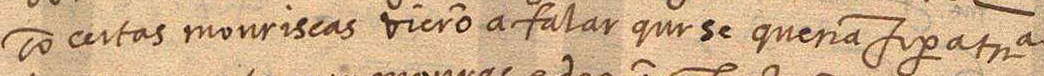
c̄o certas mouriscas vierō a falar que se queriā Jr ꝑa trra
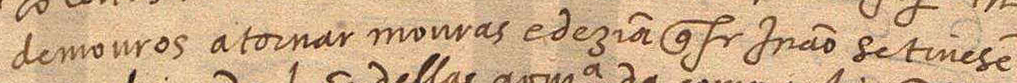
de mouros a tornar mouras e deziā q̄ se Jrião se tiuesē
